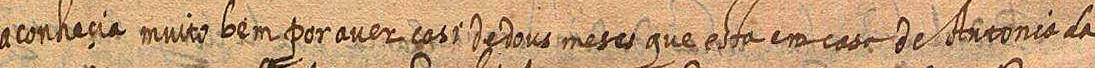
a conhecia muito bem por auer casi de dous meses que esta em casa de Antonia da
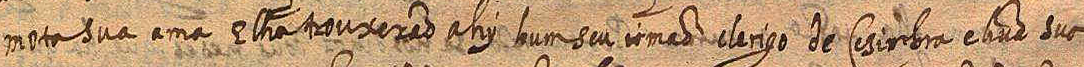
mota sua ama E lhe trouxeraõ ahy hum seu irmão clerigo de Cezimbra e huā sua
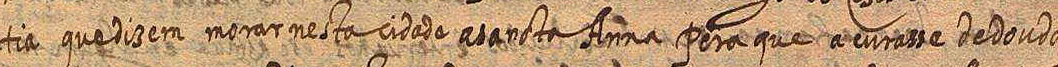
tia que dizem morar nesta cidade a sancta Anna pera que a curasse de douda
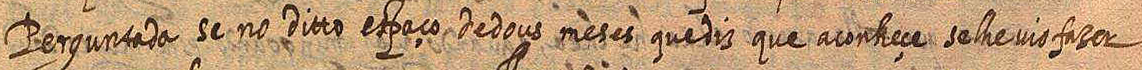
Perguntada se no ditto espaço de dous meses que diz que a conhece se lhe uio fazer
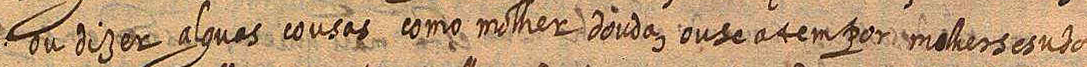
ou dizer alguas cousas como molher douda, ou se a tem por molher sesuda
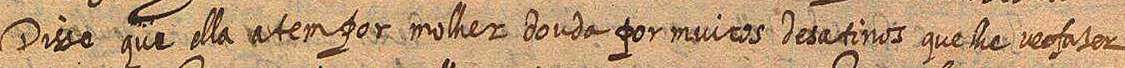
Disse que ella a tem por molher douda por muitos desatinos que lhe ue fazer
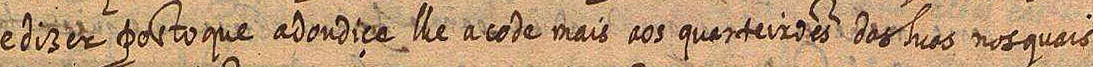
e dizer posto que a doudice lhe acode mais aos quarteiroẽs das luas nos quais
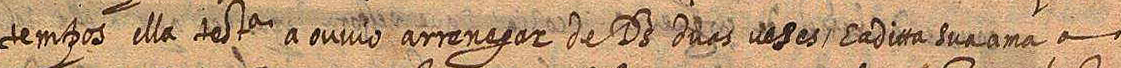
tempos ella testa a ouuio arrenegar de Ds̄ duas vezes / E a ditta sua ama a
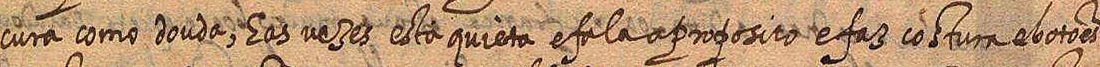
cura como douda, E as uezes esta quieta e fala a proposito e faz costura e botoẽs
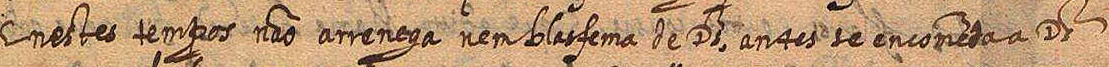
E nestes tempos não arrenega nem blasfema de Ds̄, antes se encom̄enda a Ds̄
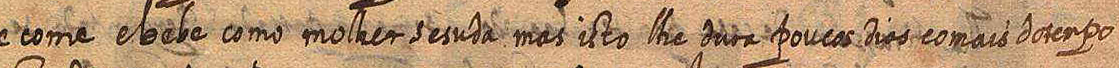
e come e bebe como molher sesuda mas isto lhe dura poucos dias e o mais do tenpo
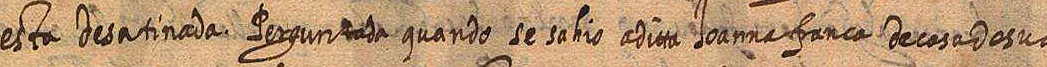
esta desatinada. Perguntada quando se sahio a ditta Ioanna franca de casa de sua
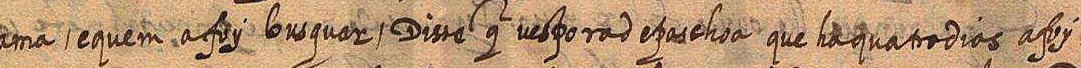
ama / e quem a foy busquar / Disse q̄ uespora de paschoa que ha quatro dias a foy
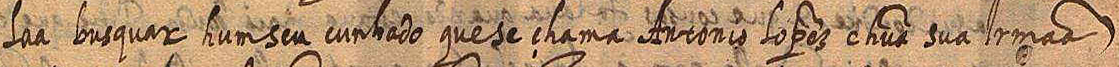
laa busquar hum seu cunhado que se chama Antonio Lopez e huā sua Irmaā
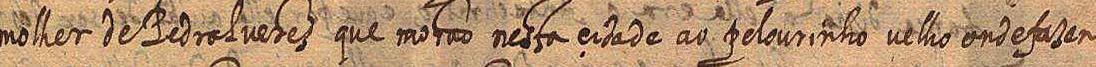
molher de Pedralueres que morão nesta cidade ao pelourinho uelho onde fazem
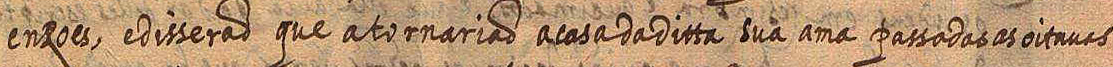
enzoes, e disserão que a tornarião a casa da ditta sua ama passadas as oitauas
